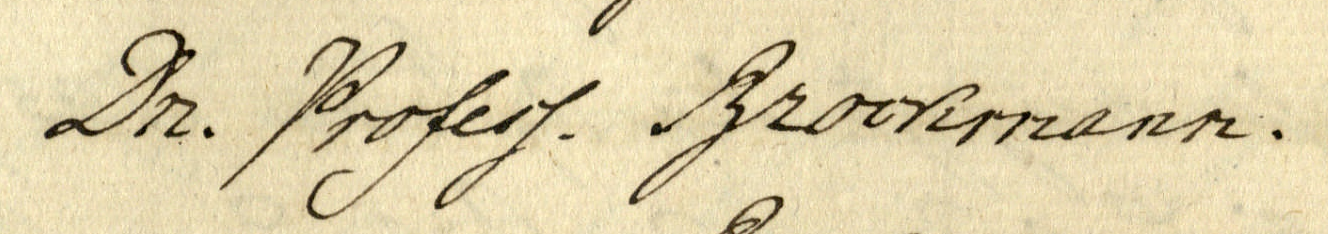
Dn. Profess. Brockmann.
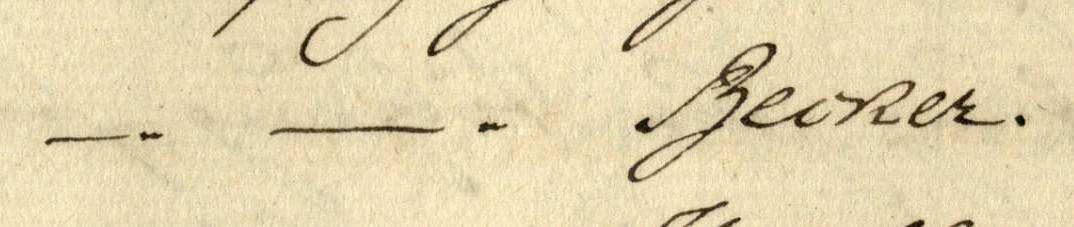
Becker.
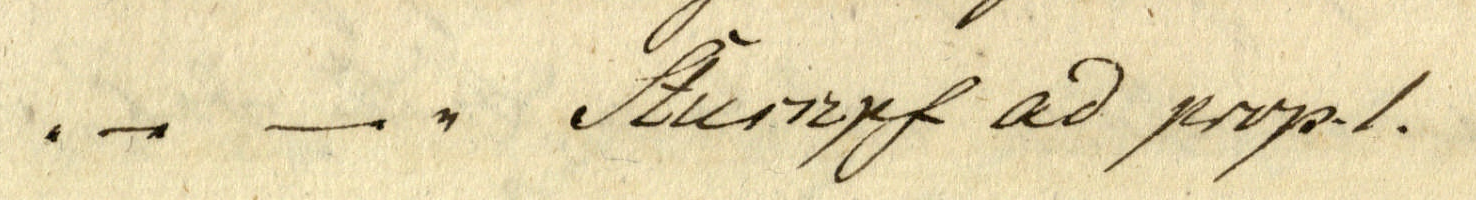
Stumpf ad prop. I.
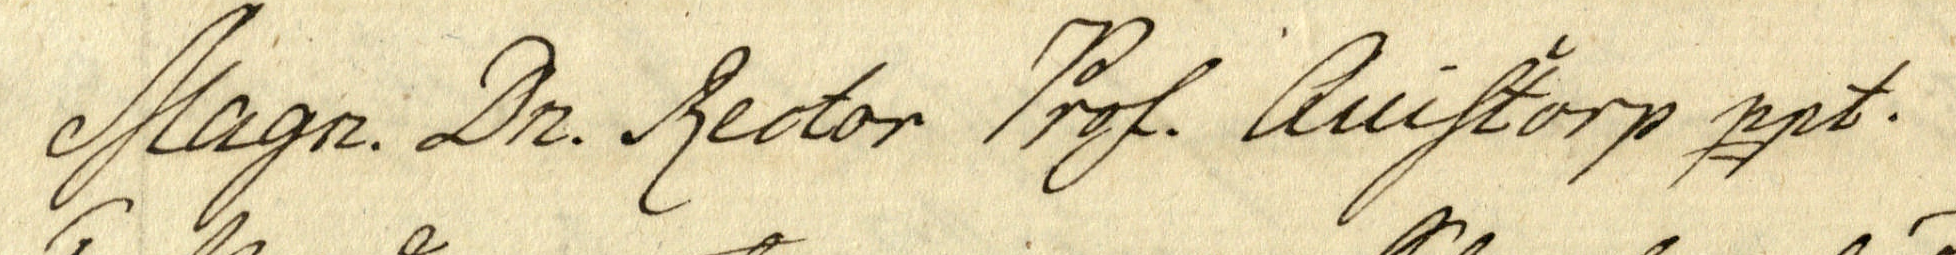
Magn. Dn. Rector Prof. Quistorp ppt.
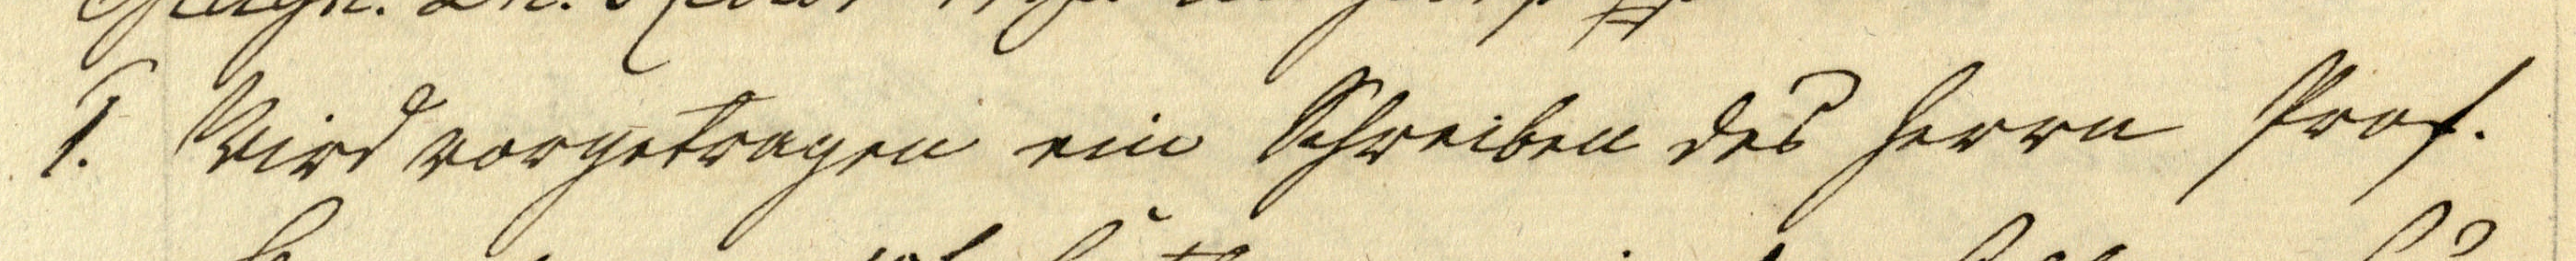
1., Wird vorgetragen ein Schreiben des Herrn Prof.
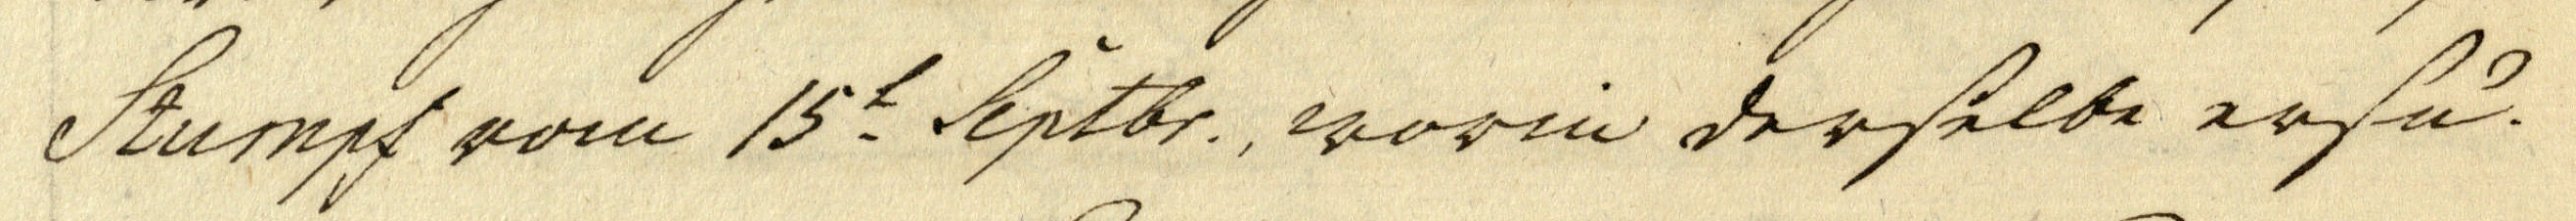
Stumpf vom 15. Septbr., worin derselbe ersu¬
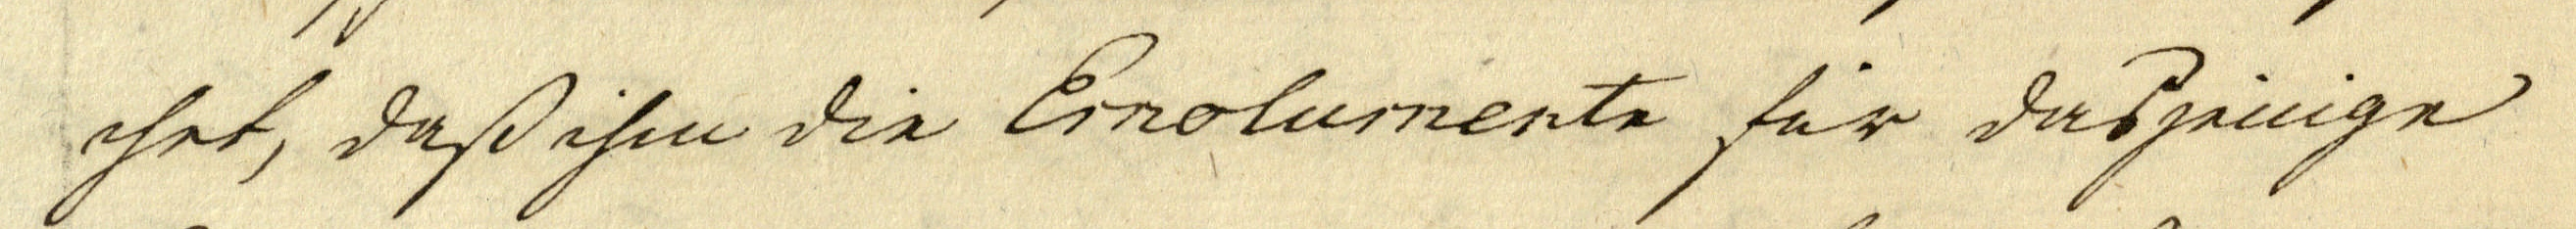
chet, daß ihm die Emolumente für dasjenige
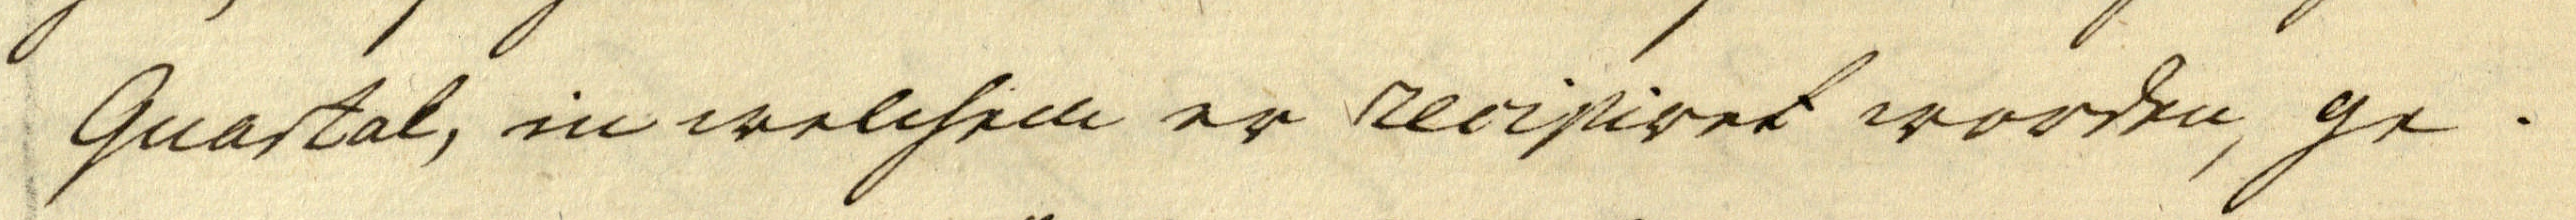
Quartal, in welchem er recipiret worden, ge¬
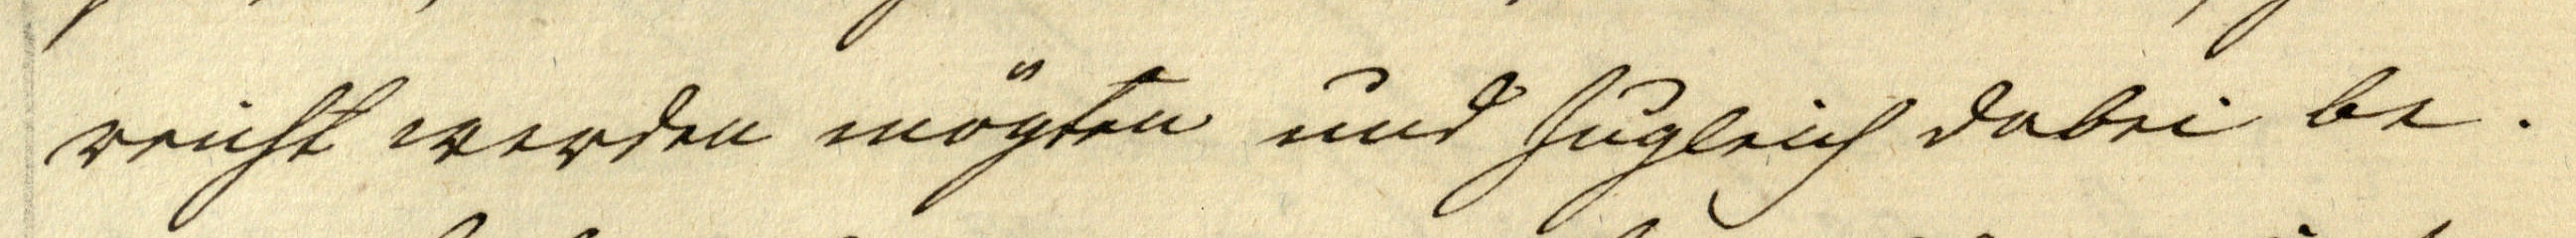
reicht werden mögten und zugleich dabei be¬
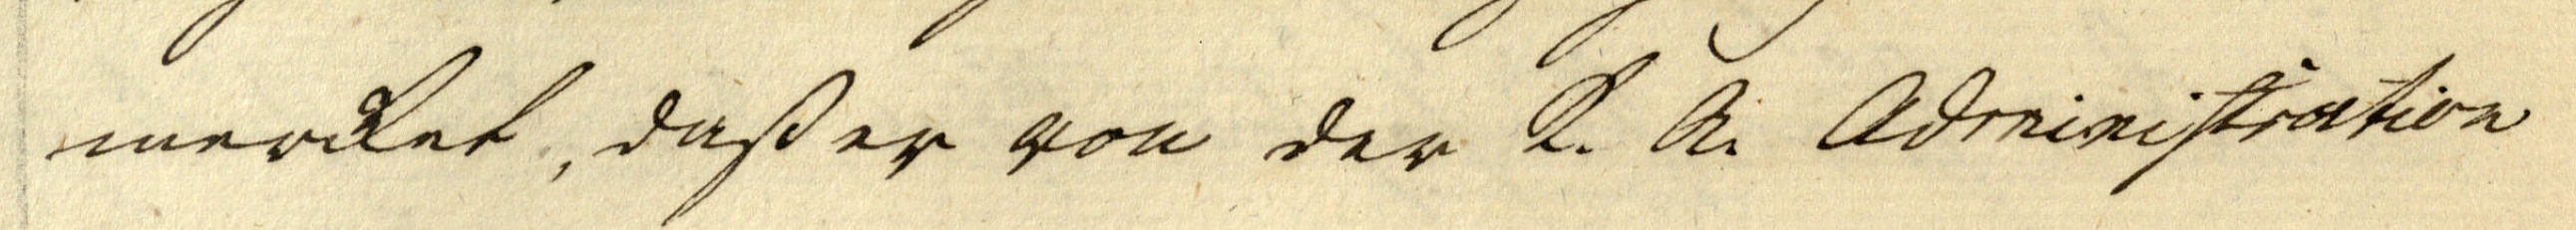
mercket, daß er von der K. A. Administration
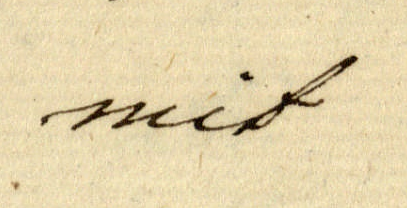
mit
